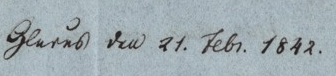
Glarus den 21. Febr. 1842.
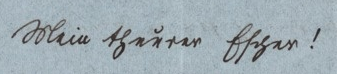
Mein theurer Escher!
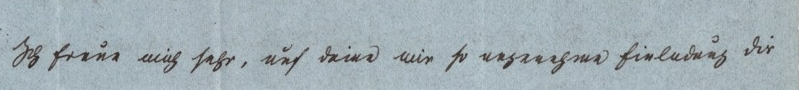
Ich freue mich sehr, auf deine mir so angenehme Einladung dir
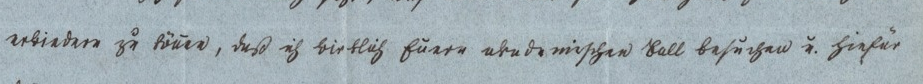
erwiedern zu können, daß ich wirklich Euern akademischen Ball besuchen u. hiefür
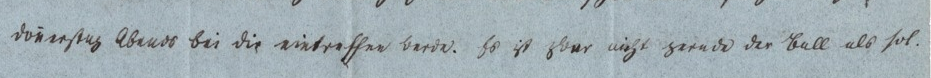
Donnerstag Abends bei dir eintreffen werde. Es ist zwar nicht gerade der Ball als sol-
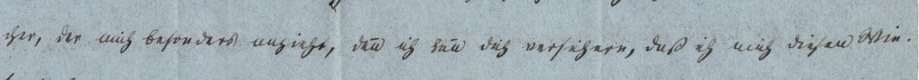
cher, der mich besonders anzieht, denn ich kann dich versichern, daß ich mich diesen Win-
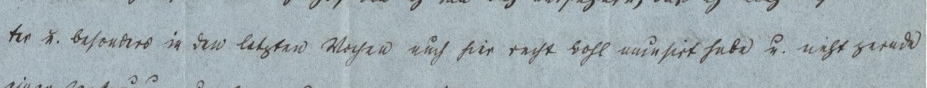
ter u. besonders in den letzten Wochen auch hier recht wohl amusirt habe u. nicht gerade
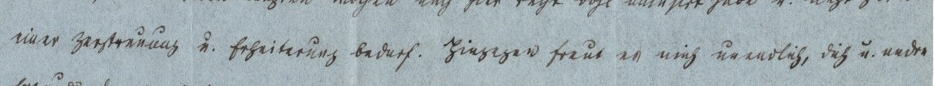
einer Zerstreuung u. Erheiterung bedarf. Hingegen freut es mich unendlich, dich u. andre
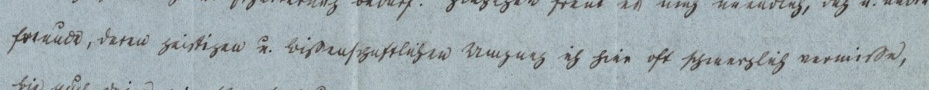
Freunde, deren geistigen u. wissenschaftlichen Umgang ich hier oft schmerzlich vermisse,
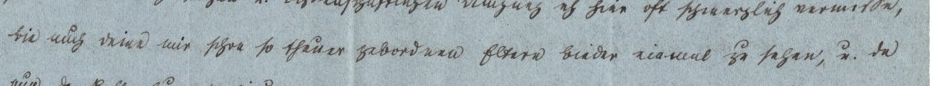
wie auch deine mir so theuer gewordnen Eltern wieder einmal zu sehen, u. da
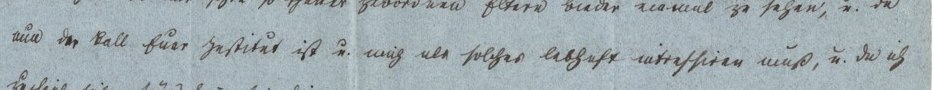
nun der Ball Euer Institut ist u. mich als solches lebhaft intressiren muß, u. da ich
